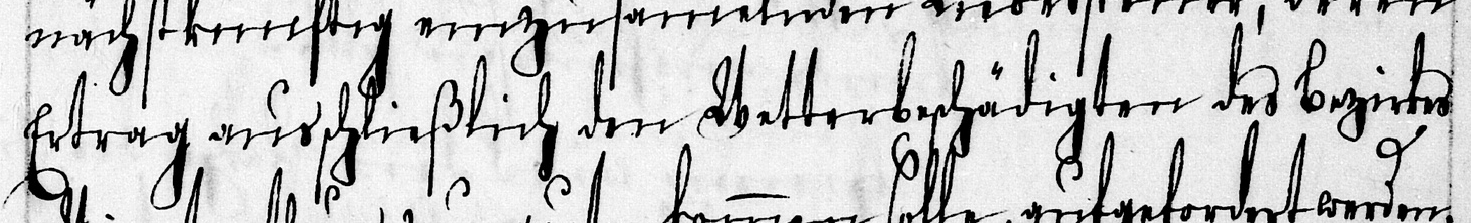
Ertrag ausschließlich den Wetterbeschädigten des Bezirkes
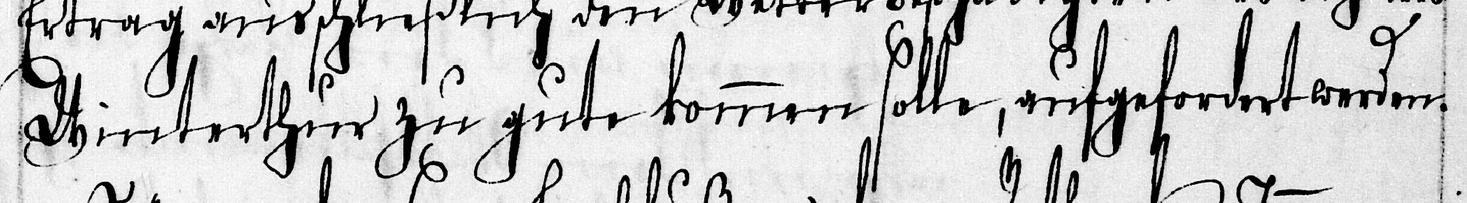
Winterthur zu gute kommen solle, aufgefordert werde¬
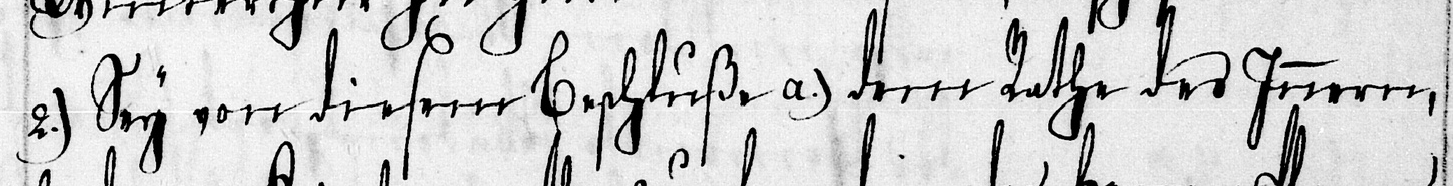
2.) Sey von diesem Beschluß a.) dem Rathe des Innern
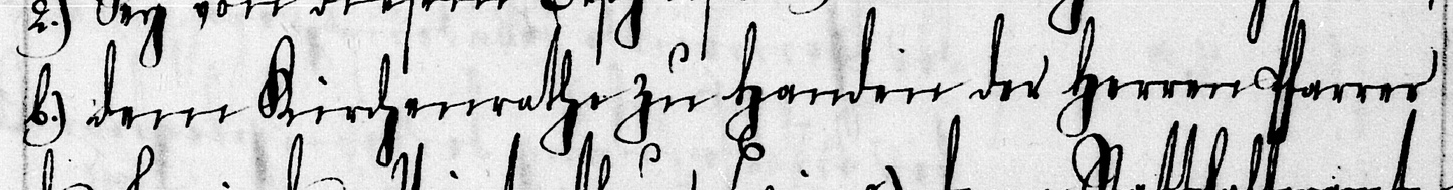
b.) dem Kirchenrathe zu Handen der Herren Pfarrer
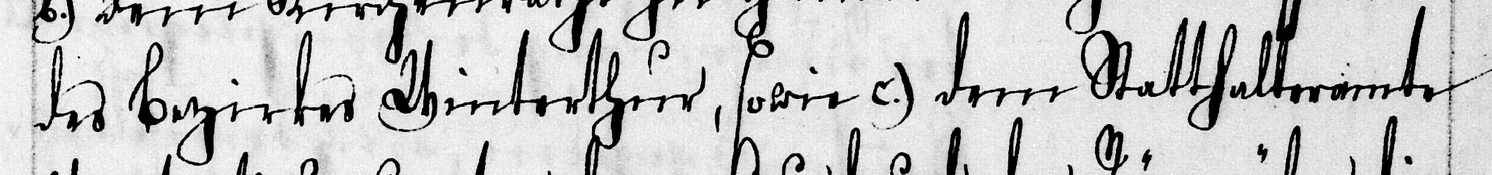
des Bezirkes Winterthur, sowie c.) dem Statthalteramte
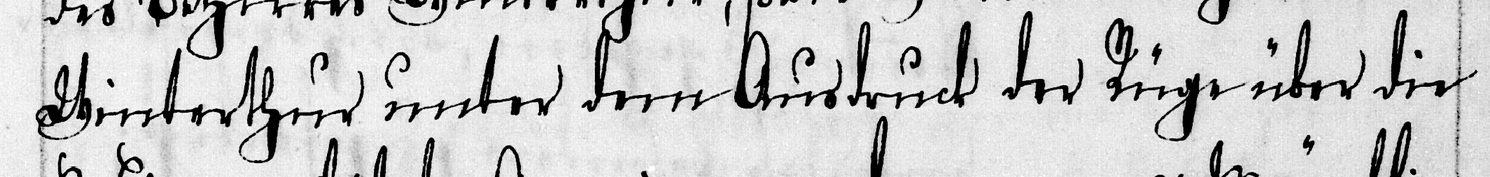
Winterthur unter dem Ausdruck der Rüge über die
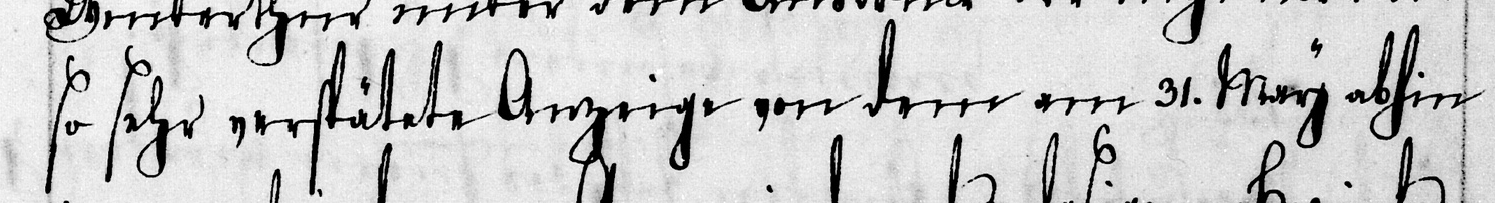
so sehr verspätete Anzeige von dem am 31. May abhin
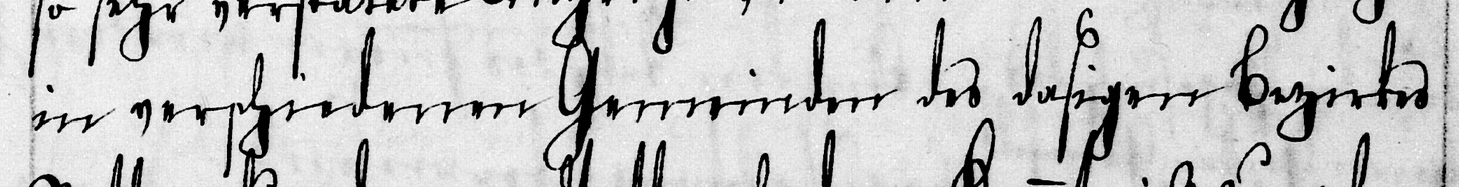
in verschiedenen Gemeinden des dasigen Bezirkes
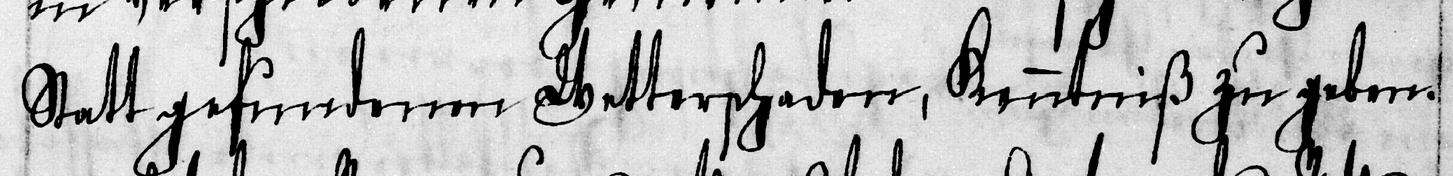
Statt gefundenen Wetterschaden, Kenntniß zu geben.
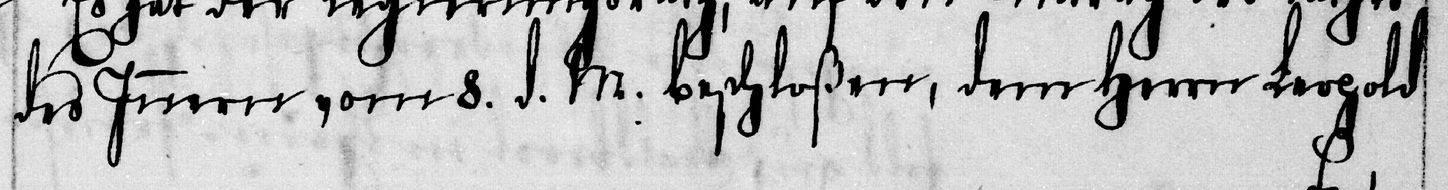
des Innern vom 8. d. M. beschloßen, dem Herrn Leopold
